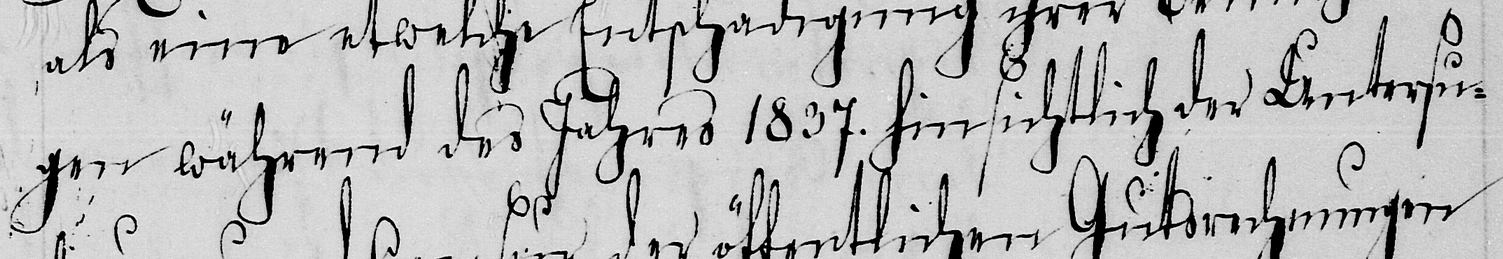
gen während des Jahres 1837. hinsichtlich der Untersu¬
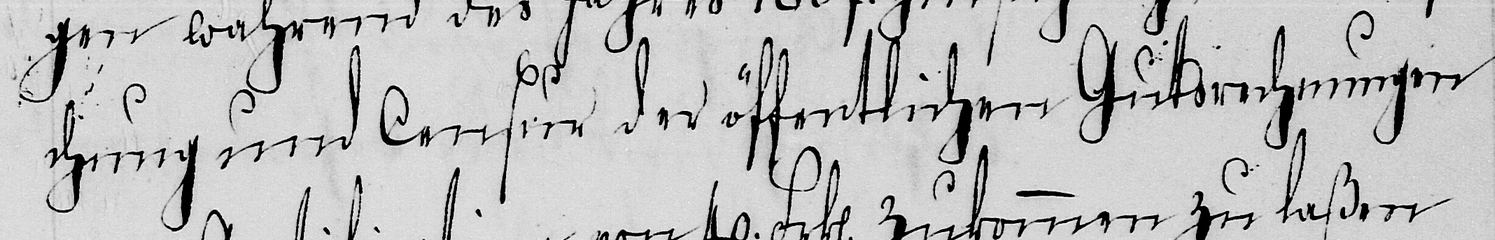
chung und Censur der öffentlichen Gutsrechnungen
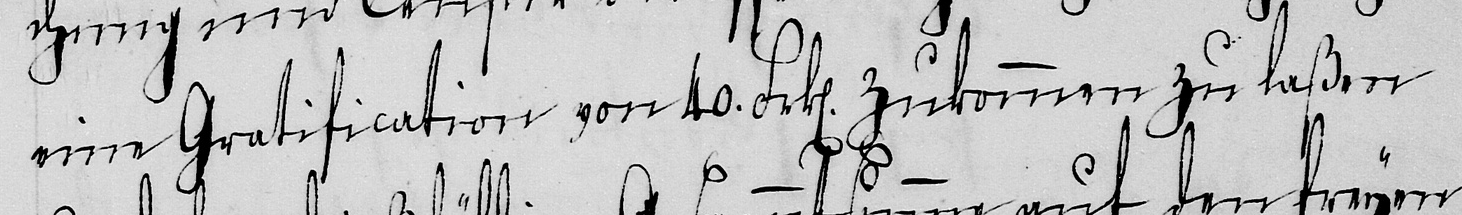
eine Gratification von 40. Frk[en]. zukommen zu laßen
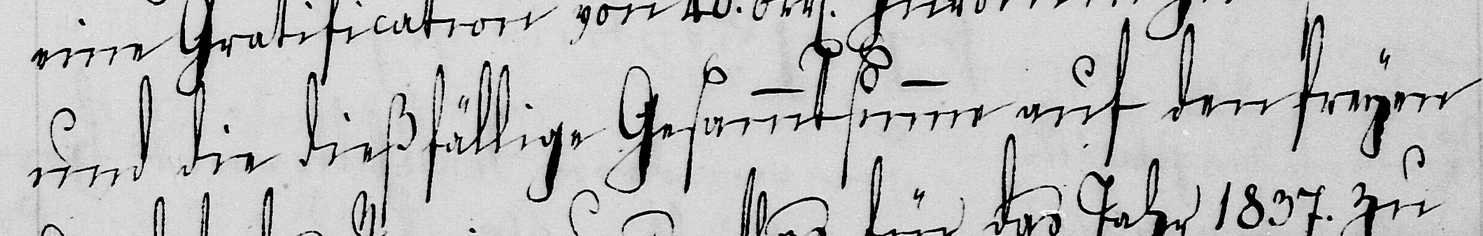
und die dießfällige Gesammtsumme auf den freyen
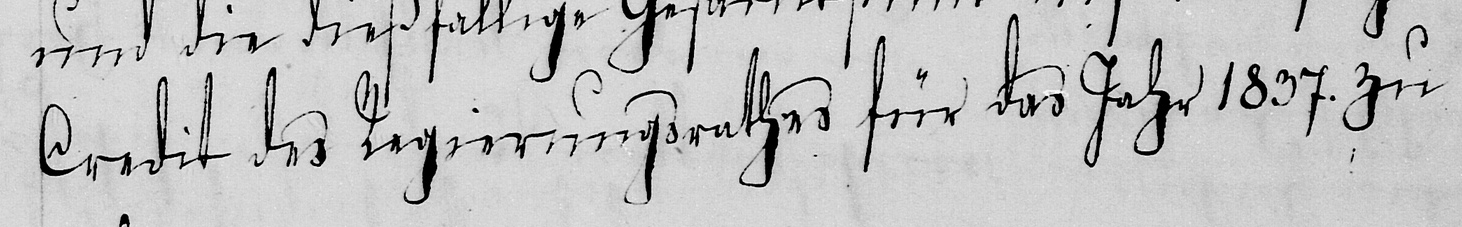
Credit des Regierungsrathes für das Jahr 1837. zu
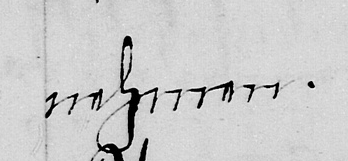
nehmen.
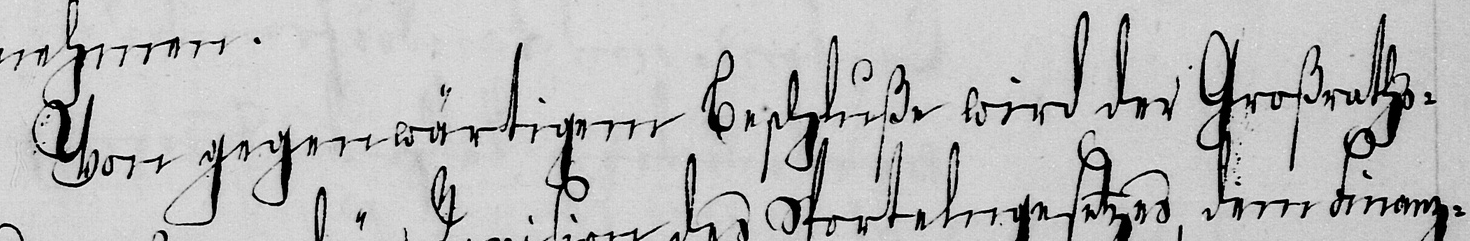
Von gegenwärtigem Beschluße wird der Großrath¬
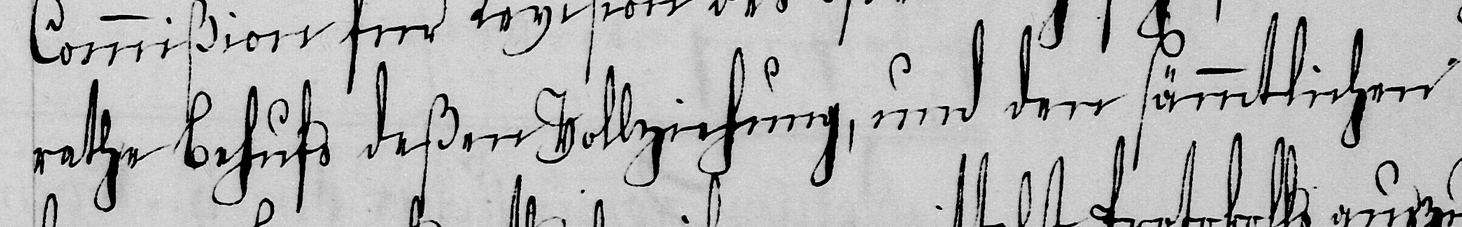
rathe Behufs deßen Vollziehung, und den sämmtlichen
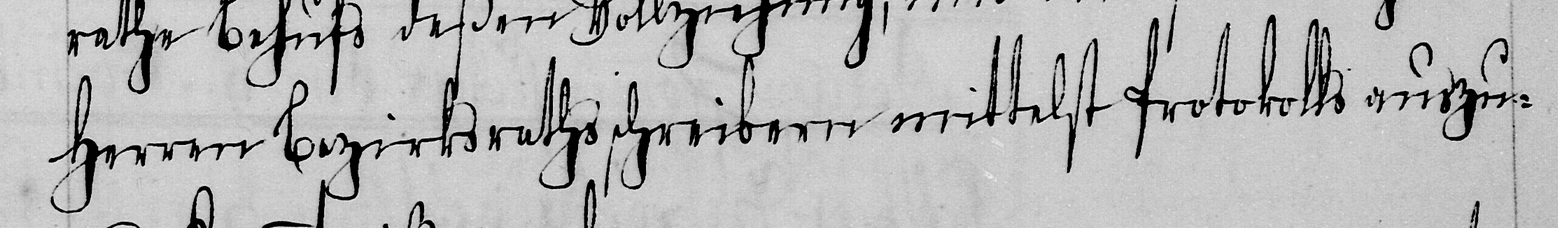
Herren Bezirksrathsschreibern mittelst Protokollsauszu¬
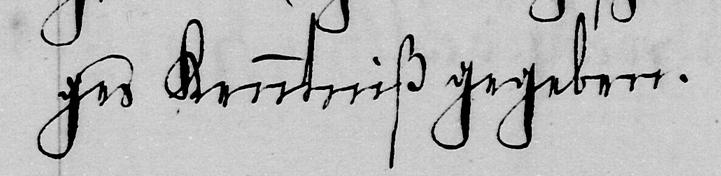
ges Kenntniß gegeben.
